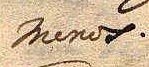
menos.
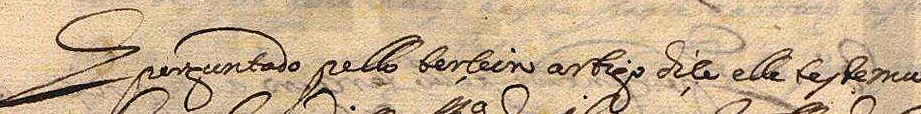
E perguntado pello terçeiro artigo diçe elle testemu
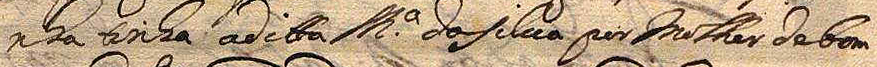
nha tinha a ditta M.a da Silua por Molher de bom
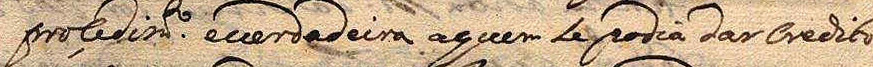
proçedimto. e uerdadeira a quem se podia dar credito
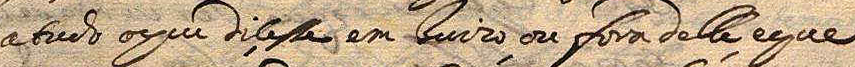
a tudo o que diçesse em Iuizo, ou fora delle, e que
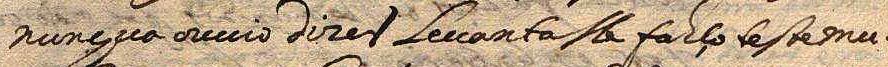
nunqua ouuio dizer Leuantasse falço testemu
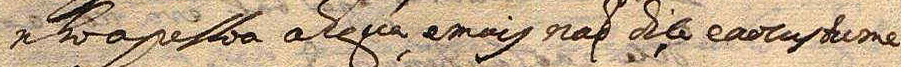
nho a pessoa alguā, e mais naõ diçe e ao custume
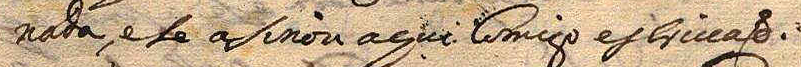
nada, e se asinou aqui Comigo escriuaõ.
